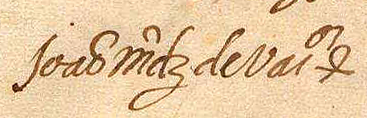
João m̄dz de Vasos
